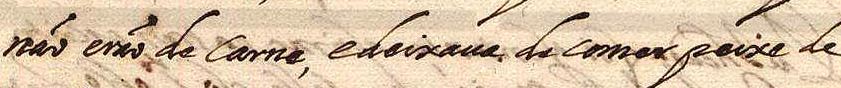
naõ eraõ de Carne, e deixaua de comer peixe de
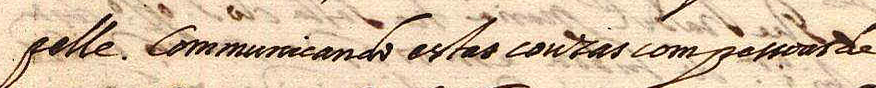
pelle. Communicando estas couzas com pessoas de
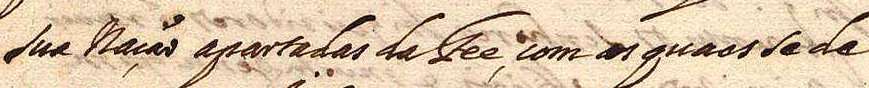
sua Naçaõ apartadas da Fee, com as quaes se de
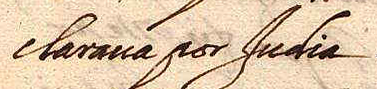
claraua por Judia.
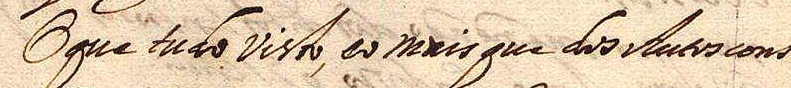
O que tudo visto, e o mais que dos Autos cons
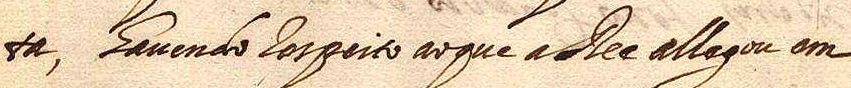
ta, hauendo Respeito ao que a Ree allegou em
